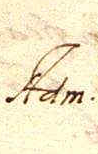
Adm.
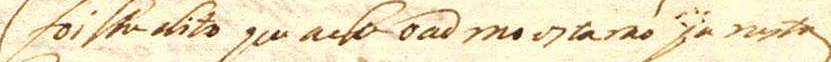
Foilhe dito que a elle o admoestaraõ ja nesta
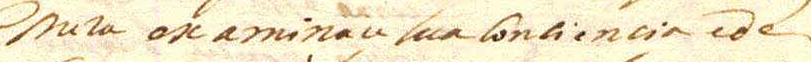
meza examinou sua conciençia e de
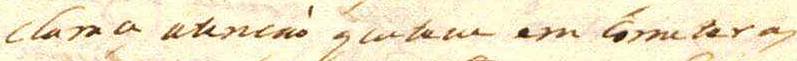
claraçe a tençaõ que teue em cometer as
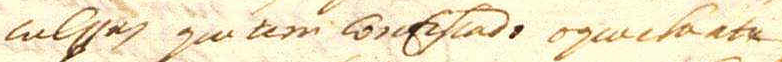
culpas que tem confessado o que ela ate
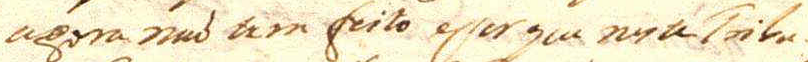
agora naõ tem feito e per que neste Tribu
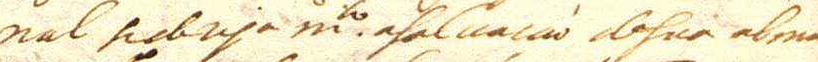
nal se dezeja mto. a saluaçaõ de sua alma,
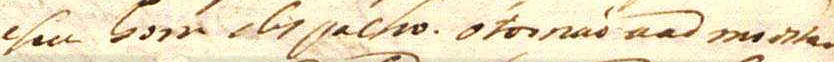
e seu bom despacho. o tornaõ a admoesta
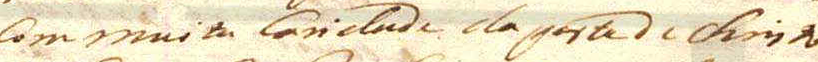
com muita Caridade da parte de christo
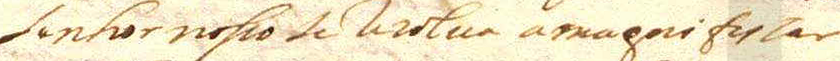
senhor nosso se Rezolua a magnifestar
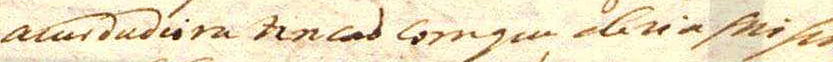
a uerdadeira tencaõ com que dezia missa
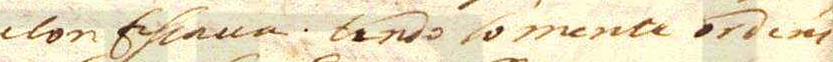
e confessaua. tendo sómente ordens
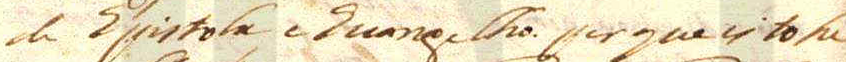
de Epistola, e Euangelho per que isto he
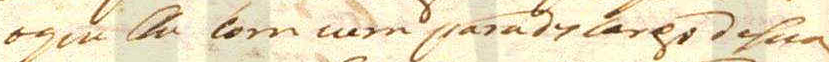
o que lhe comuem para descargo de sua
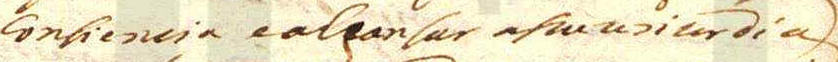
consiençia e alcancar a mezericordia
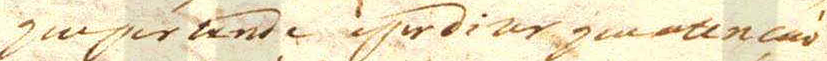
que pertende e por dizer que a tençaõ
